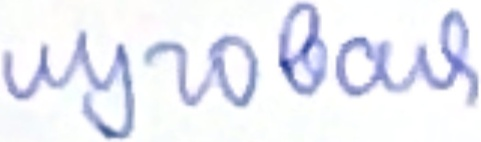луговая
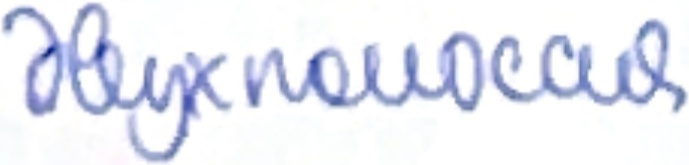двухполосая
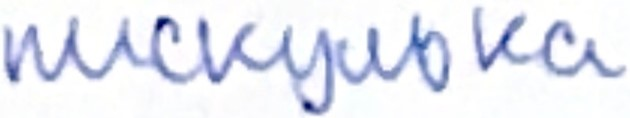пискулька
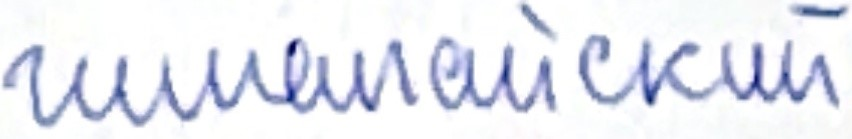гималайский
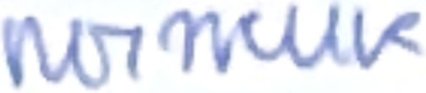пыжик
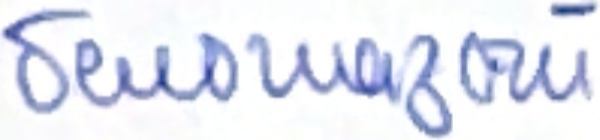белоглазый
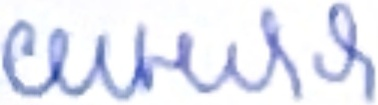синяя
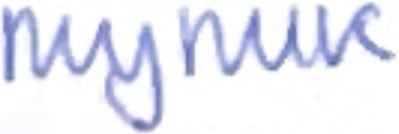тупик
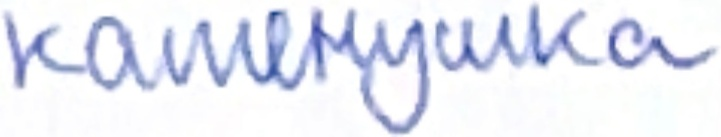каменушка
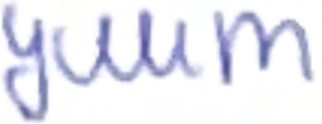улит
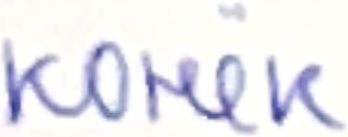конёк
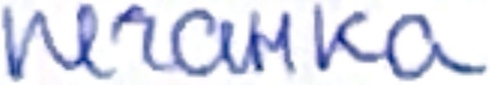пеганка
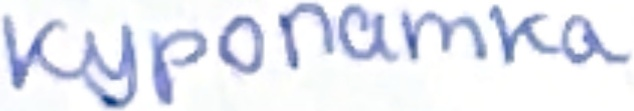куропатка
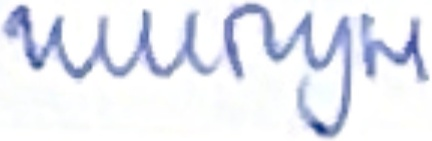шипун
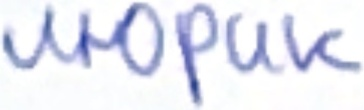люрик
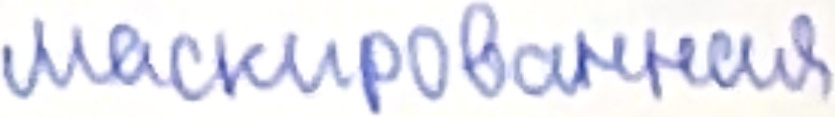маскированная
